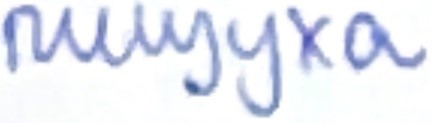пищуха
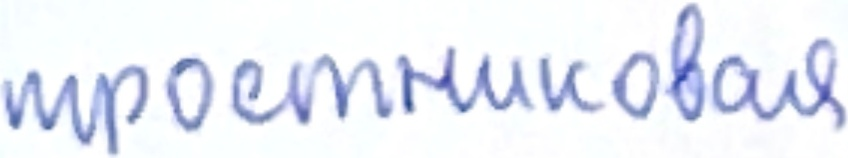тростниковая
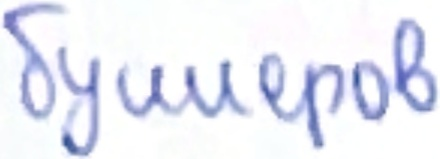буллеров
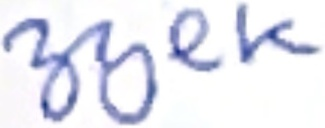ззек
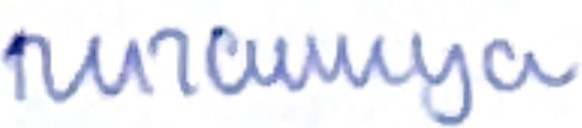пигалица
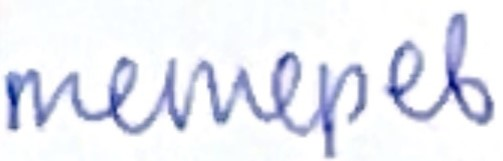тетерев
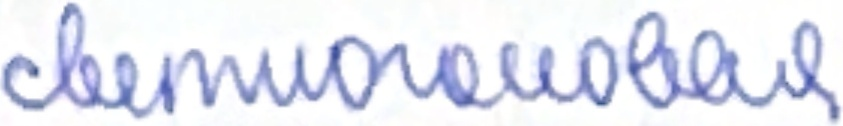светлогомовая
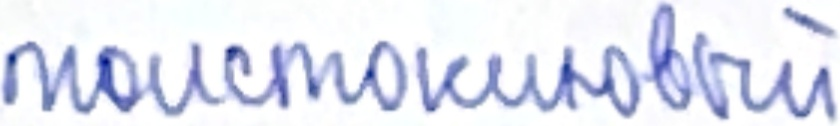толстоклювый
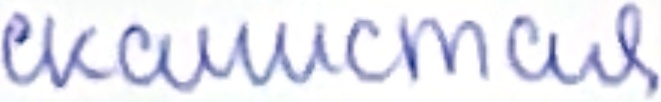скалистая
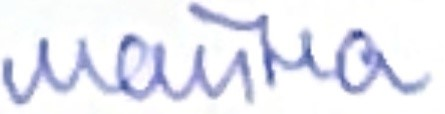майна
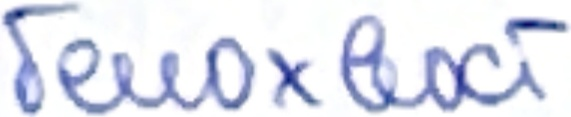белохвост
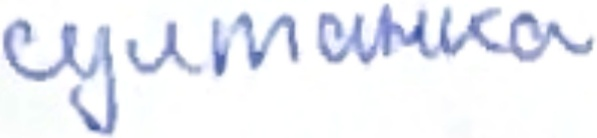султанка
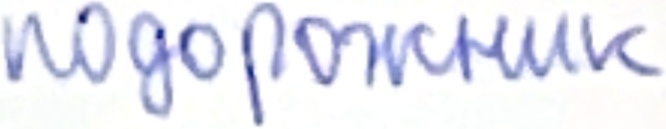подорожник
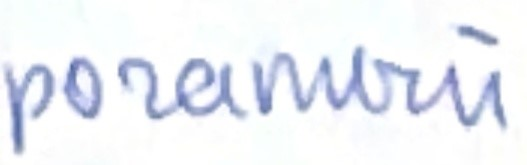рогатый
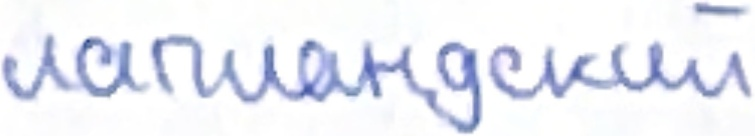лапландский
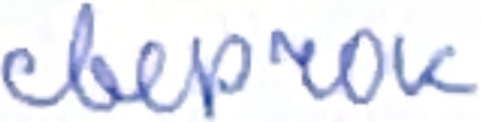сверчок
